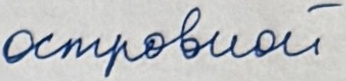островной
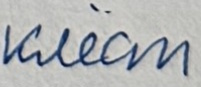клёст
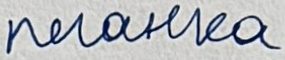пеганка
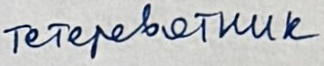тетеревятник
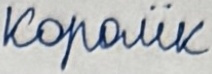королёк
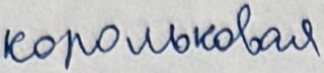корольковая
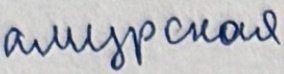амурская
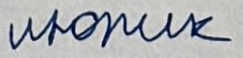люпик
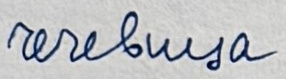чечевица
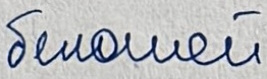белошей
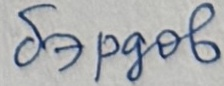бэрдов
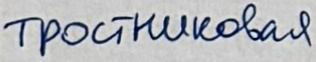тростниковая
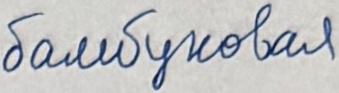бамбуковая
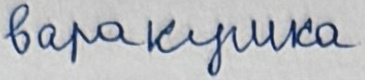варакушка
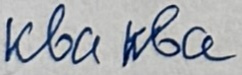ква ква
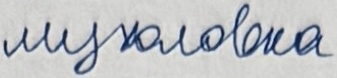мухоловка
